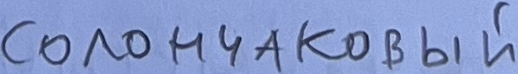солончаковый
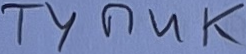тупик
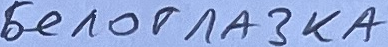белоглазка
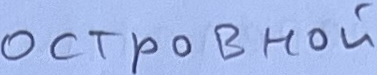островной
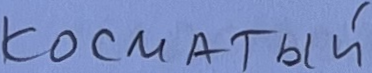косматый
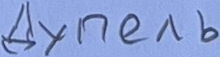дупель
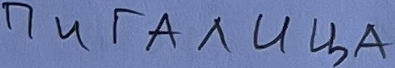пигалица
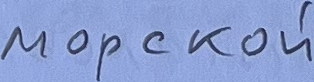морской
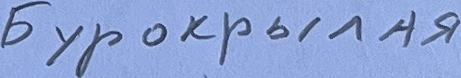бурокрылая
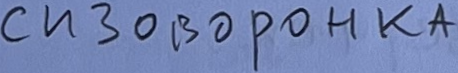сизоворонка
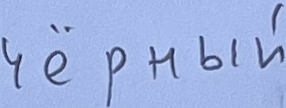чёрный
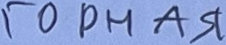горная
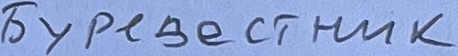буревестник
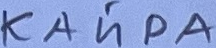кайра
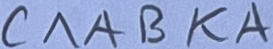славка
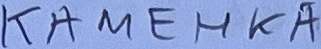каменка
